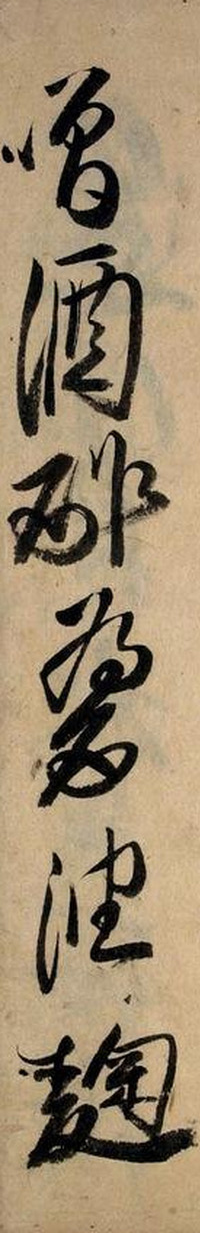噌酒酢為醤油麹
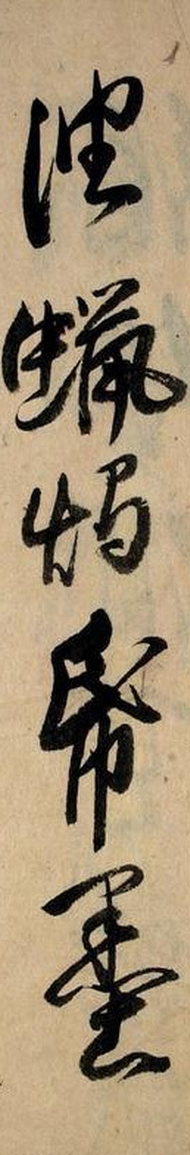油蝋燭紙墨
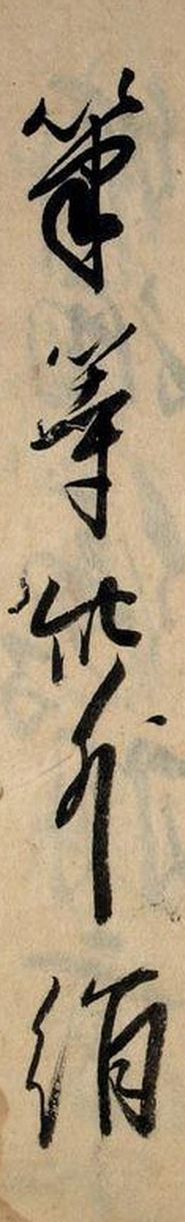筆等此外絹
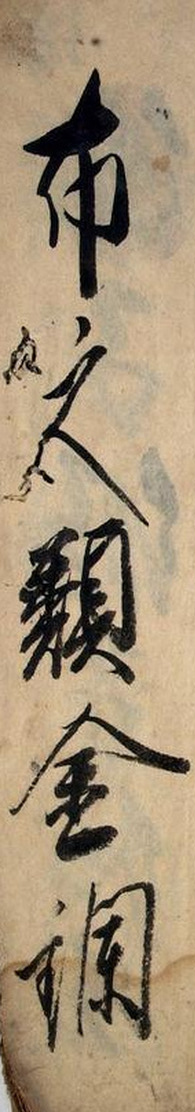布之類金襴

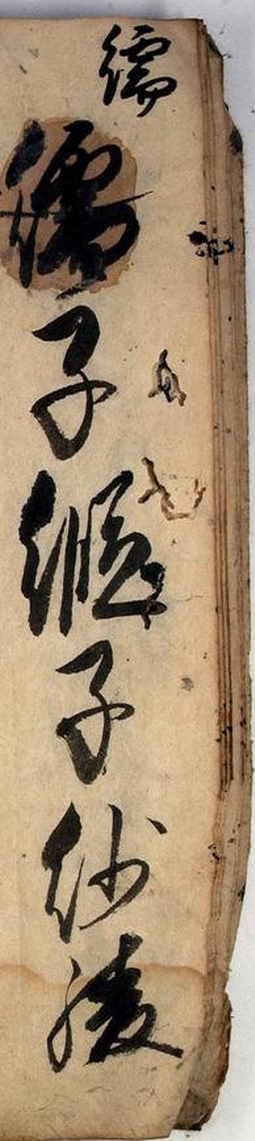繻子緞子紗綾
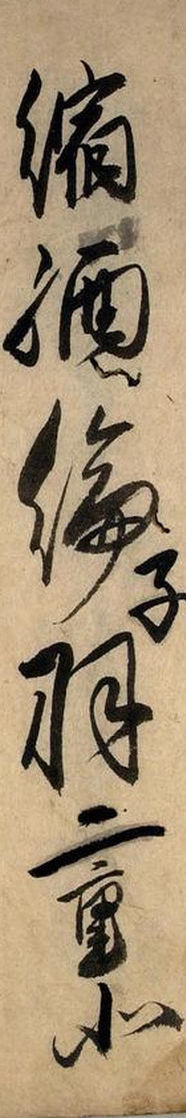縮緬綸子羽二重北
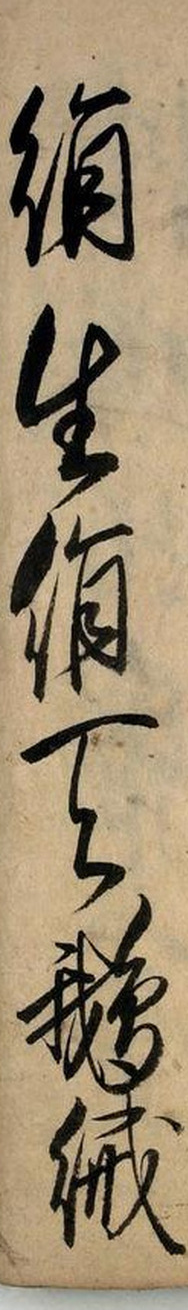絹生絹天鵞絨
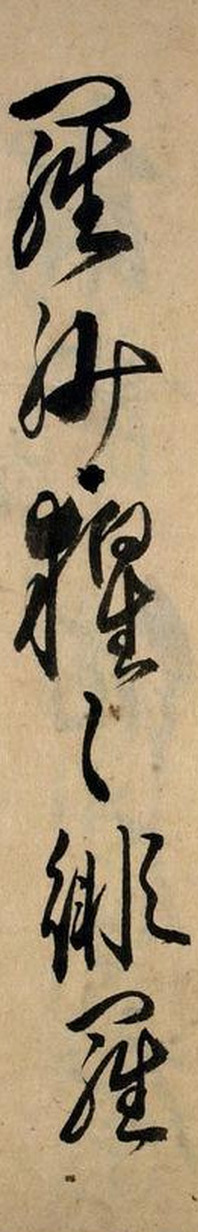羅紗猩々緋羅
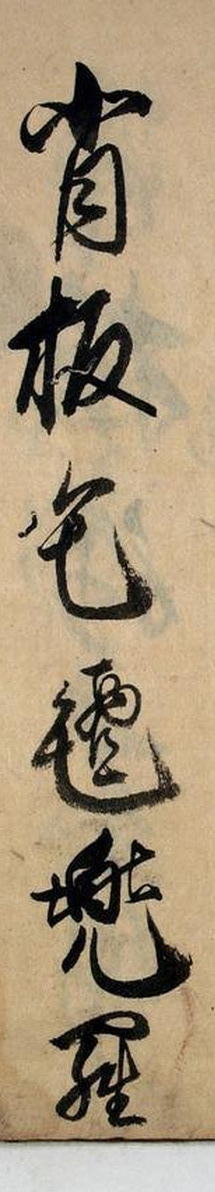背板毛氈兜羅
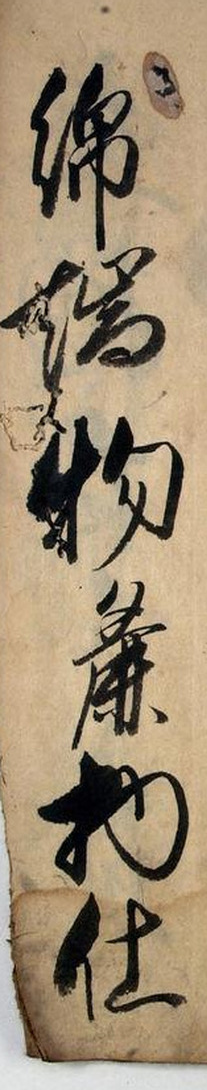綿端物麁物仕

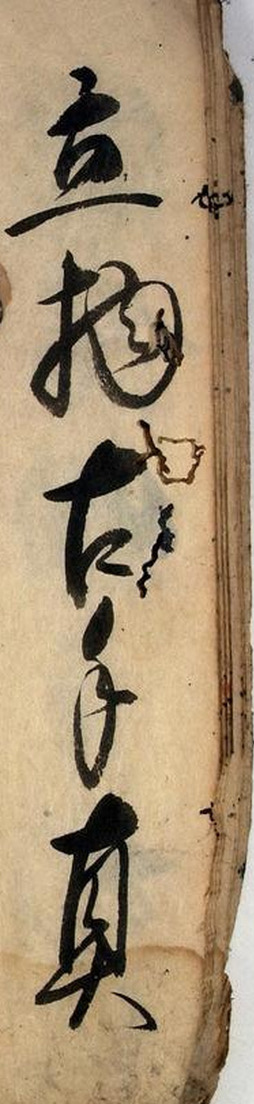立物古手真
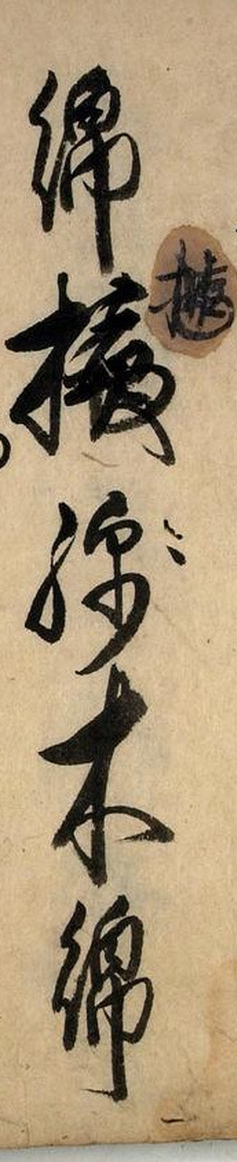綿摘綿木綿
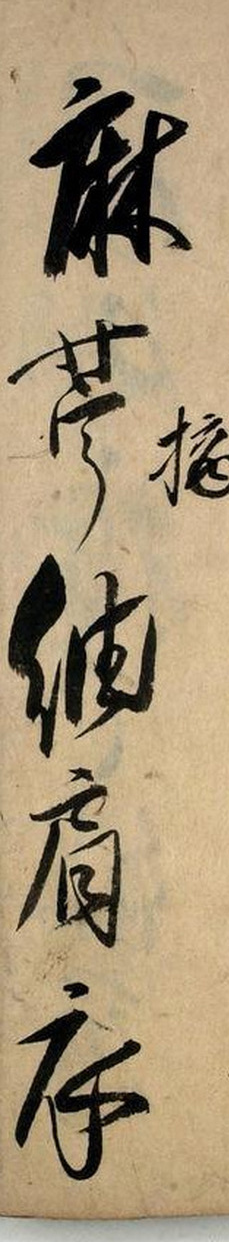麻苧紬肩衣
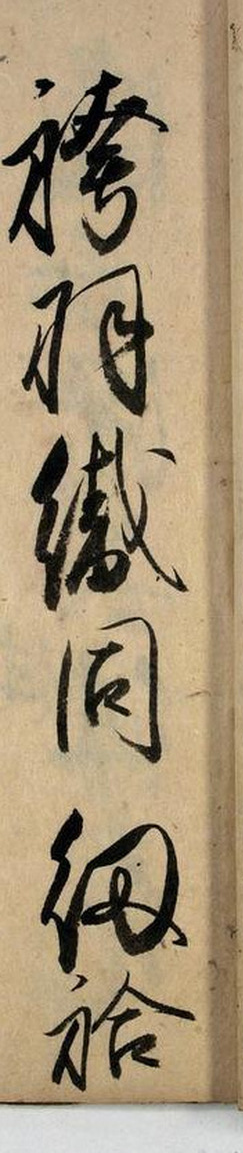袴羽織同紐袷
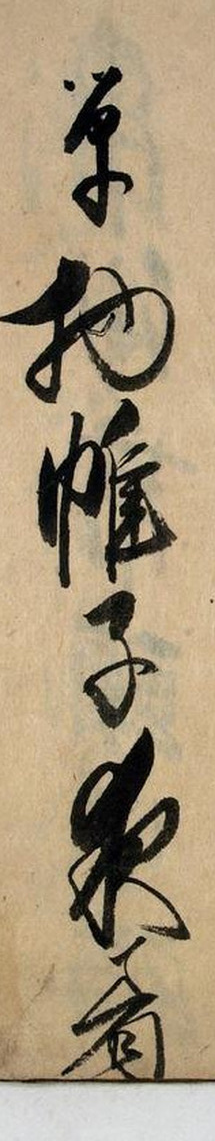単物帷子夜着

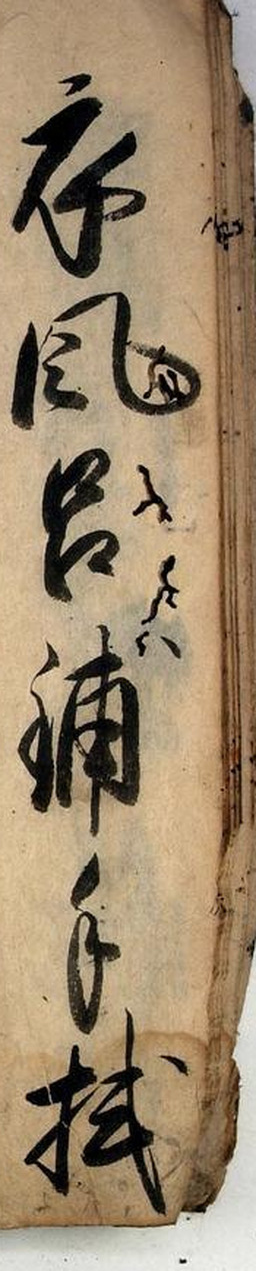衣風呂鋪手拭
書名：商売往来（往来物、手習、市之助・市兵衛の名もあり）
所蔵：福井県文書館 Fukui Prefectural Archives
